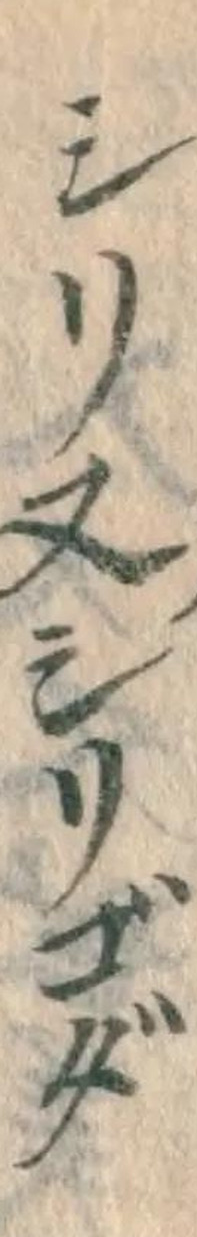シリ又シリゴダ
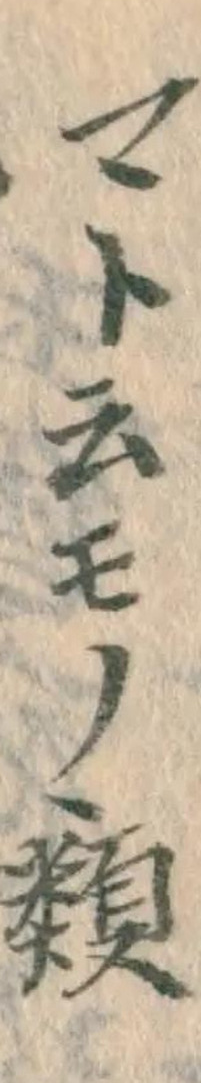マト云モノヽ類

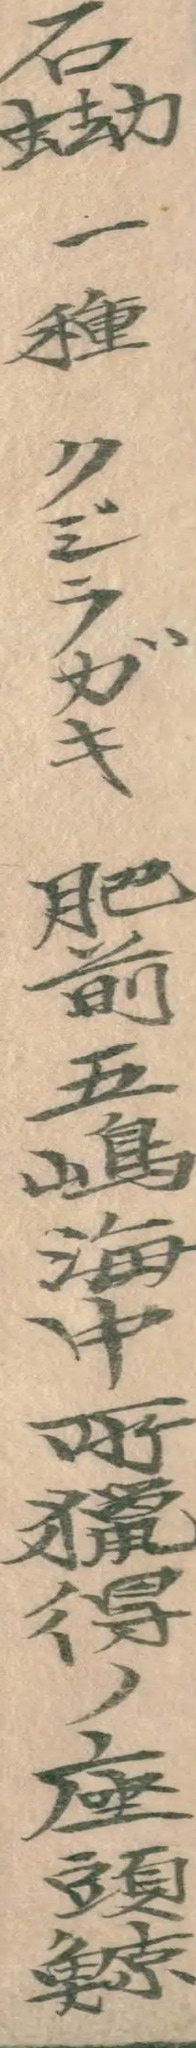石蜐一種クジラガキ肥前五嶋海中所猟得ノ座頭鯨
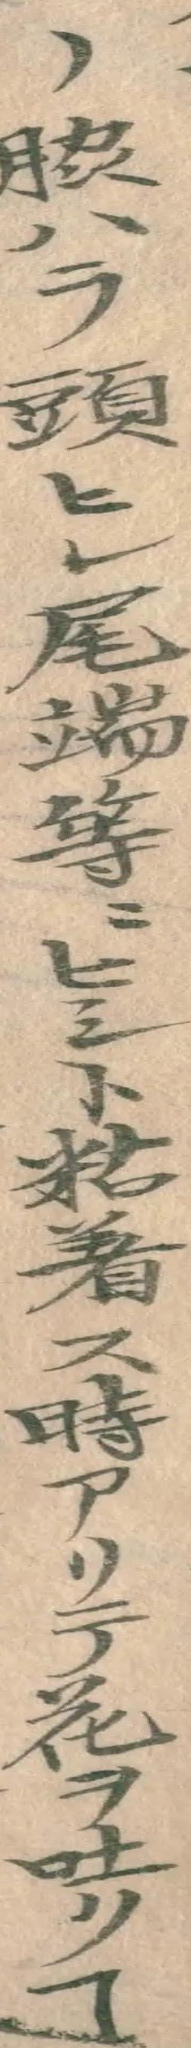ノ脇ハラ頭ヒレ尾端等ニヒシト粘着ス時アリテ花ヲ吐クコト
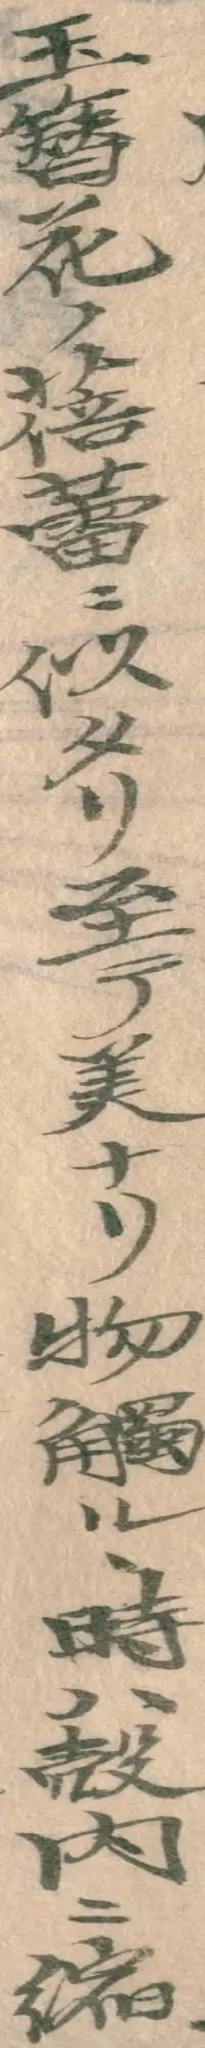玉簪花ノ蓓蕾ニ似タリ至テ美ナリ物触ルヽ時ハ殻内ニ縮
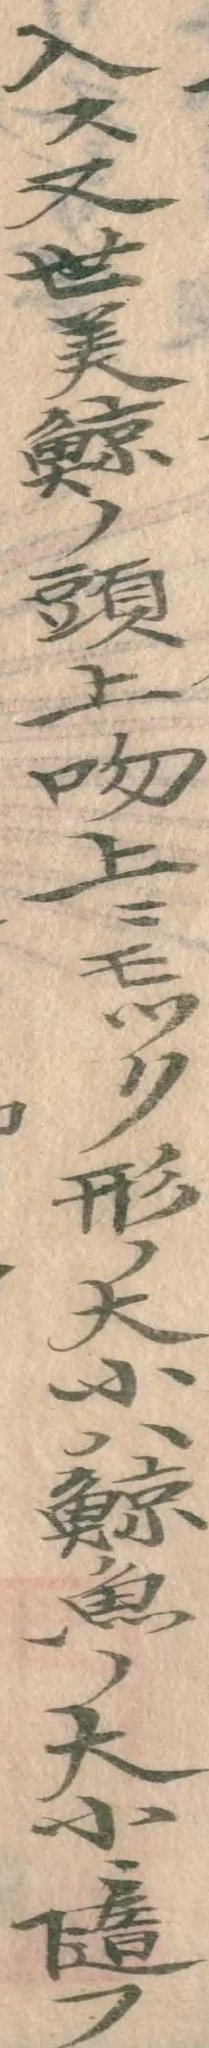入ス又世美鯨ノ頭上吻上ニモツク形ノ大小ハ鯨魚ノ大小ニ随フ
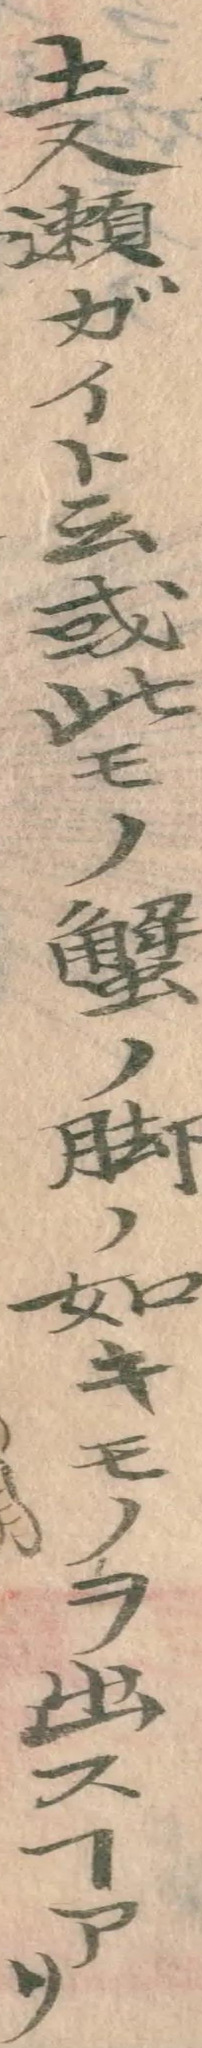土人瀬ガイト云或此モノ蟹ノ脚ノ如キモノヲ出スコトアリ
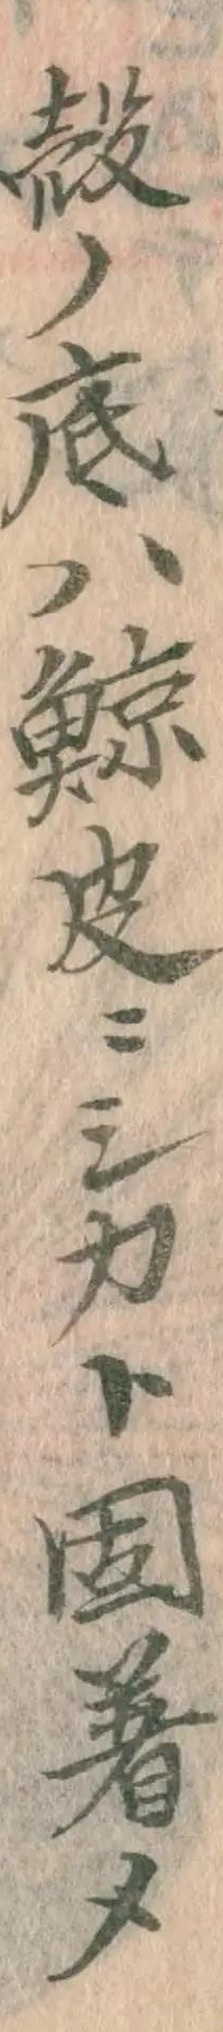殻ノ底ハ鯨皮ニシカト固着シテ
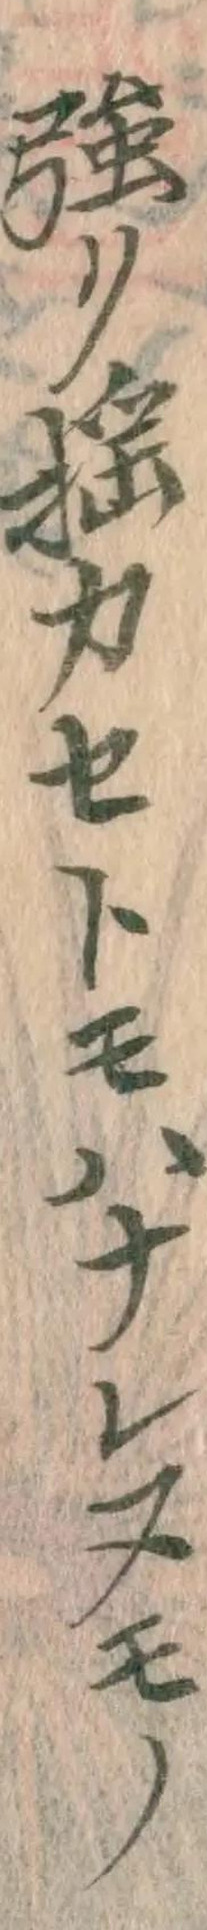強ク揺カセトモハナレヌモノ

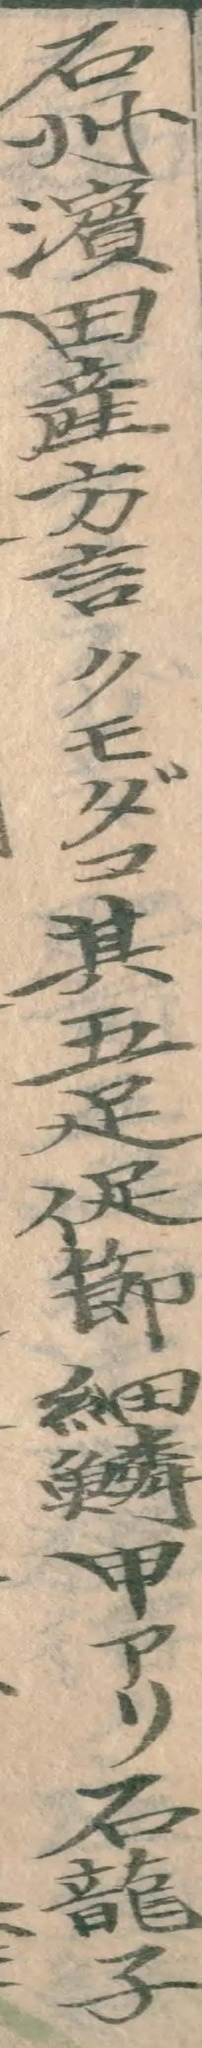石州濱田産方言クモダコ其五足促節細鱗甲アリ石龍子
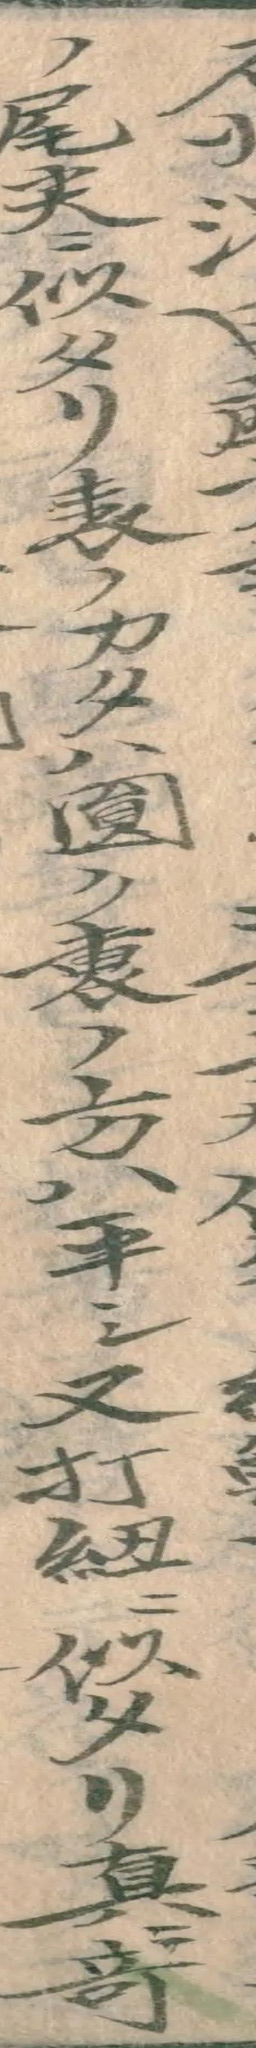ノ尾尖ニ似タリ表ノカタハ円ク裏ノ方ハ平シ又打紐ニ似タリ真ニ奇
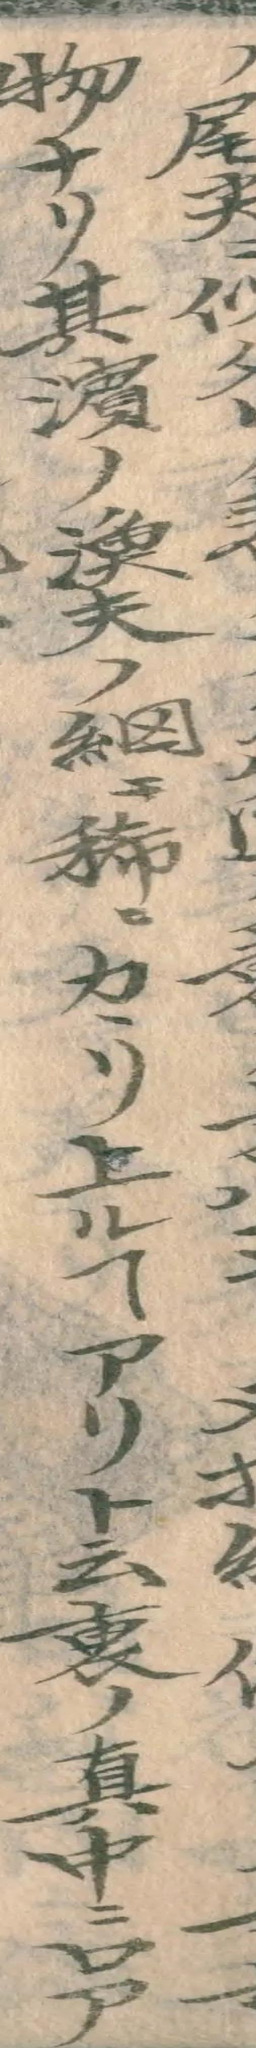物ナリ其浜ノ漁夫ノ網ニ稀ニカヽリ上ルコトアリト云裏ノ真中ニ口ア
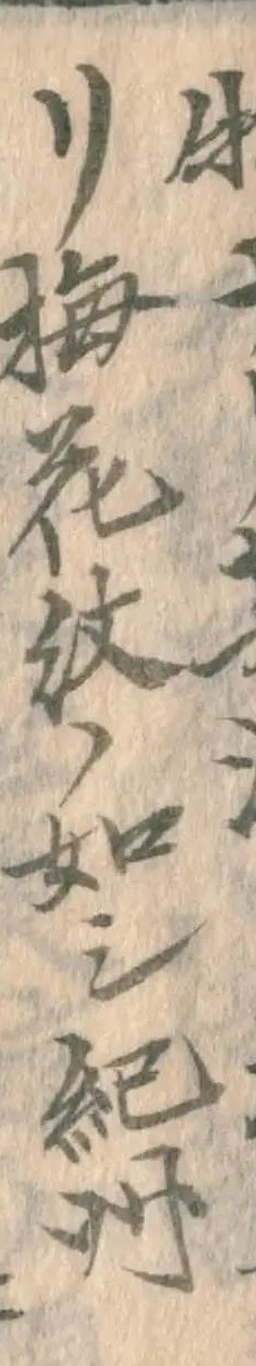リ梅花紋ノ如シ紀州
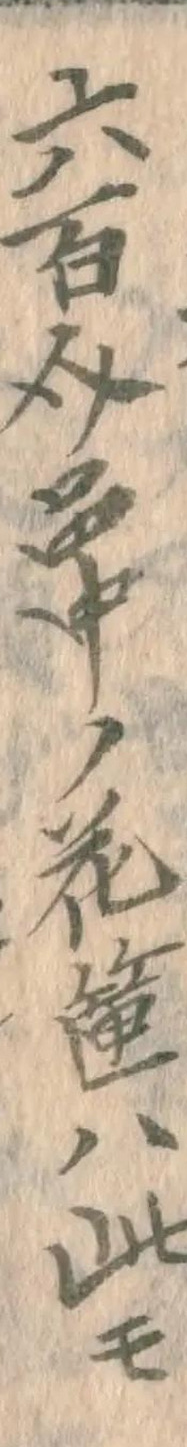六百介品中ノ花筪ハ此モ
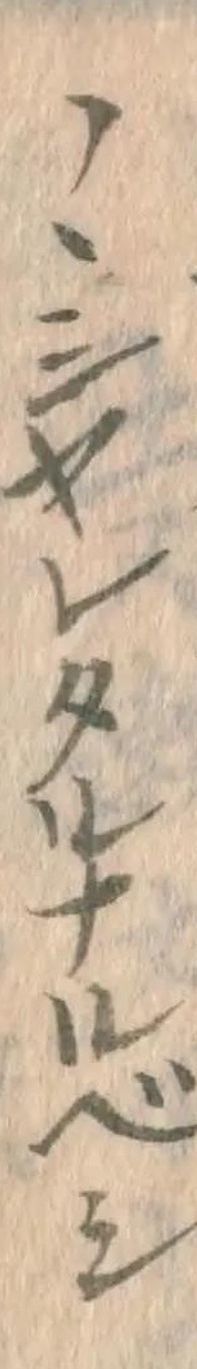ノヽシヤレタルナルベシ
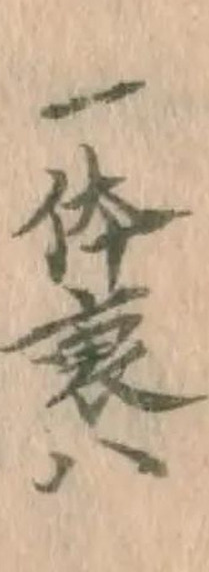一体裏ハ
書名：千蟲譜 3巻. [3]
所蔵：国立国会図書館 National Diet Library, JAPAN
